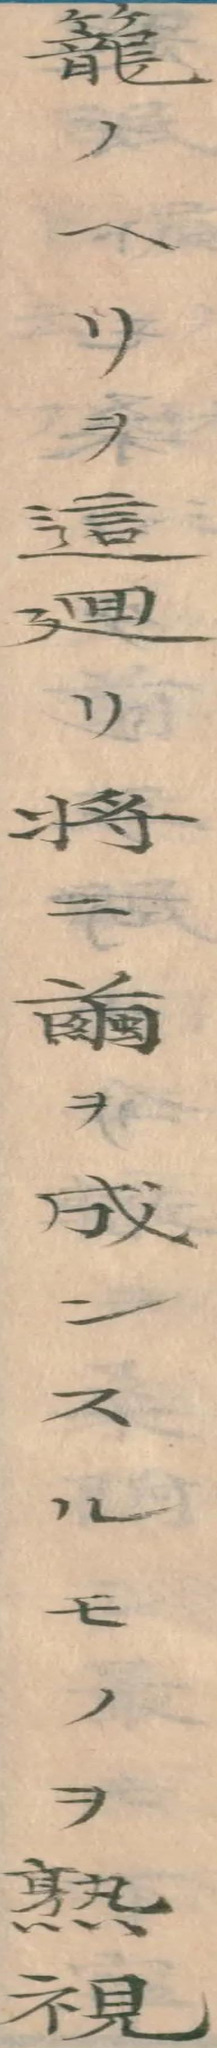籠ノヘリヲ這廻リ将ニ繭ヲ成ンスルモノヲ熟視
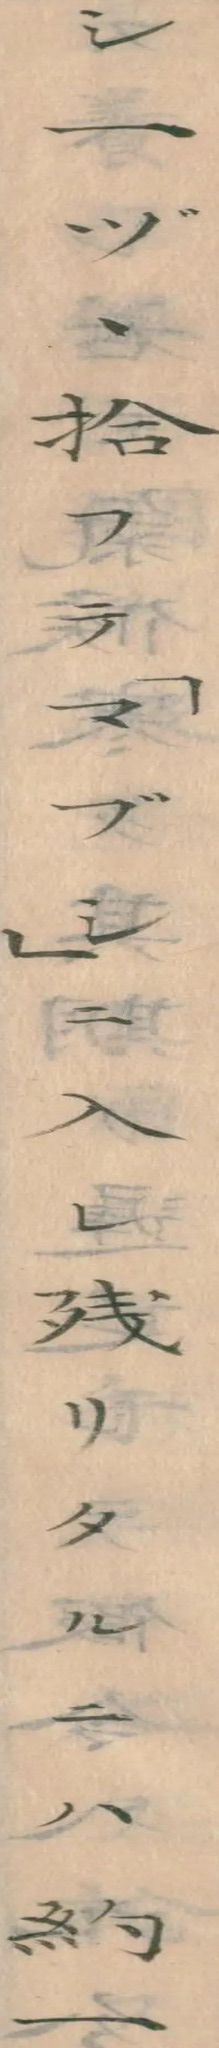シ一ヅヽ拾フテ「マブシ」ニ入レ残リタルニハ約一
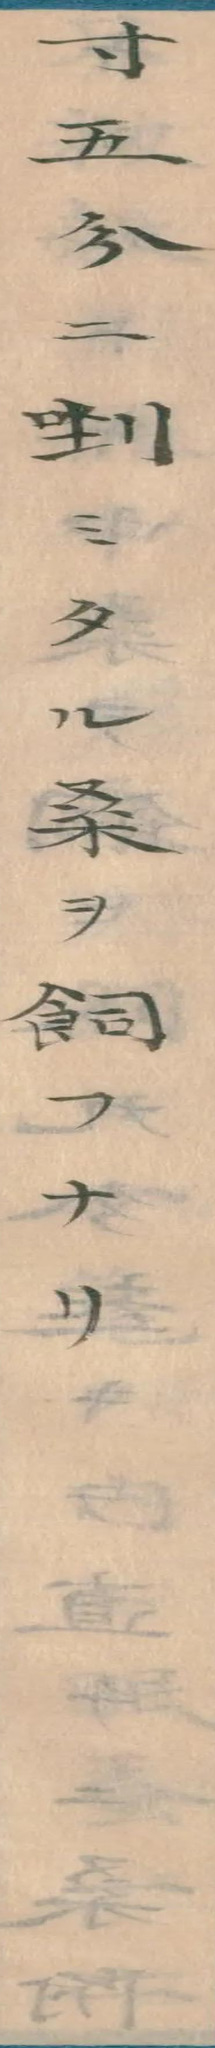寸五分ニ剉ミタル桑ヲ飼フナリ
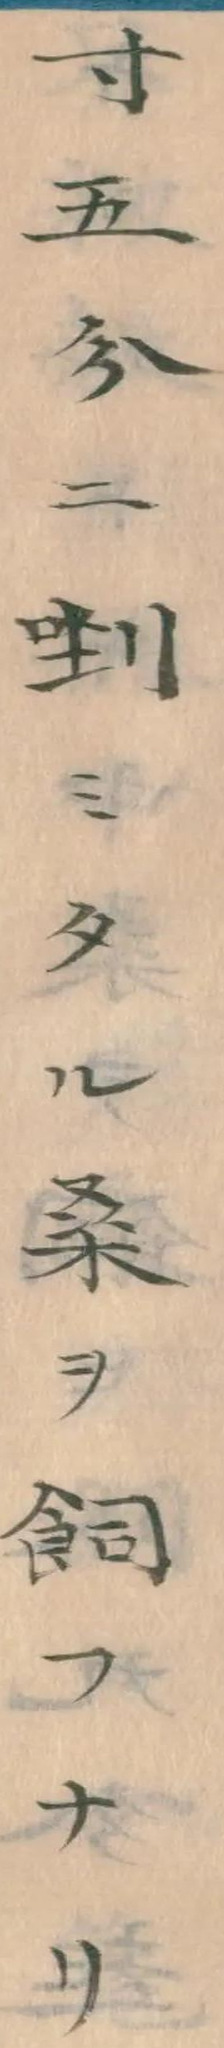寸五分ニ剉ミタル桑ヲ飼フナリ
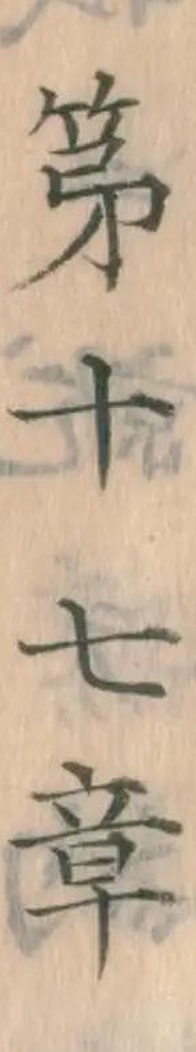第十七章
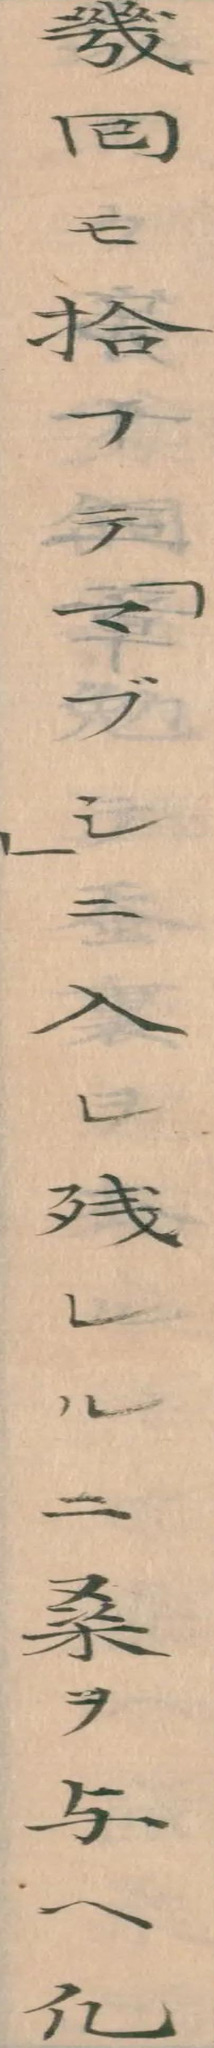幾回モ拾フテ「マブシ」ニ入レ残レルニ桑ヲ与ヘ凡
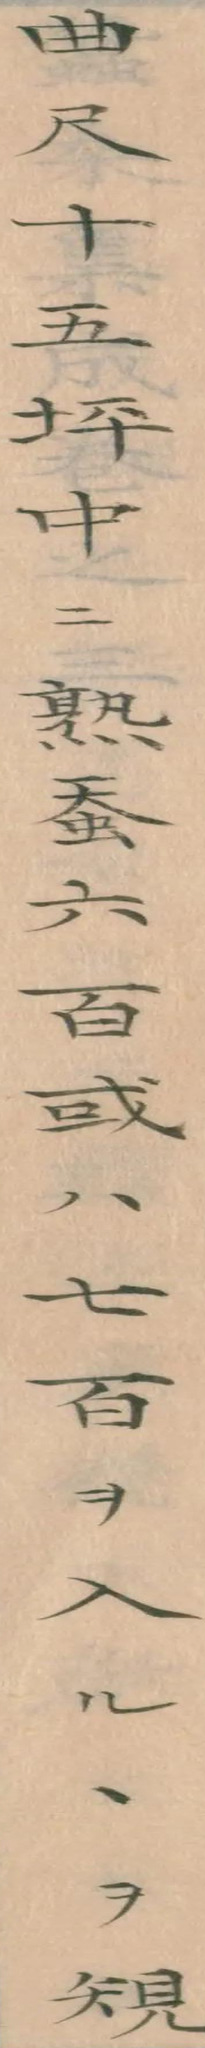曲尺十五坪中ニ熟蚕六百或ハ七百ヲ入ルヽヲ䂓
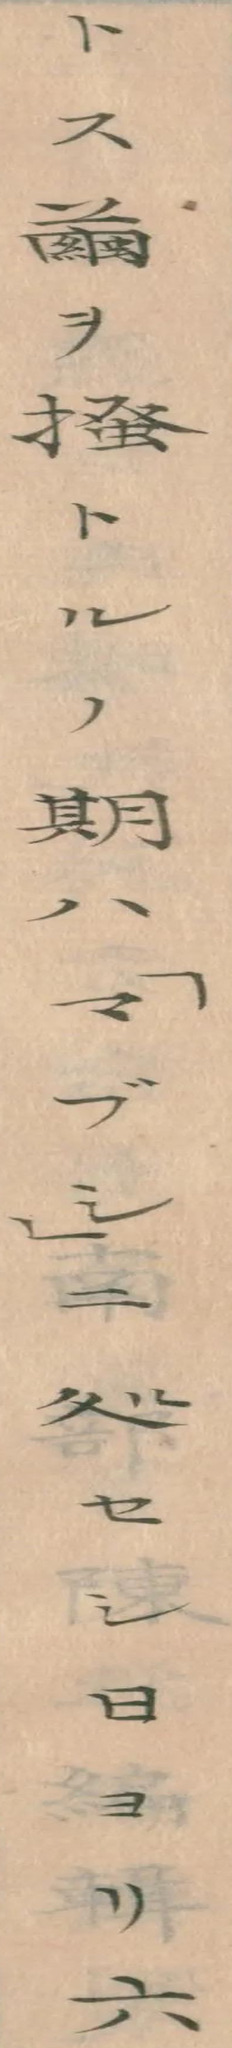トス繭ヲ掻トルノ期ハ「マブシ」ニ処セシ日ヨリ六
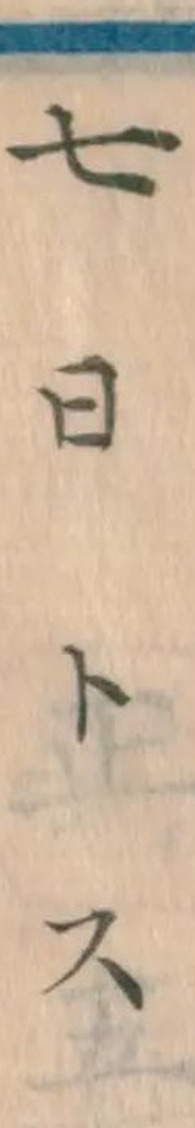七日トス
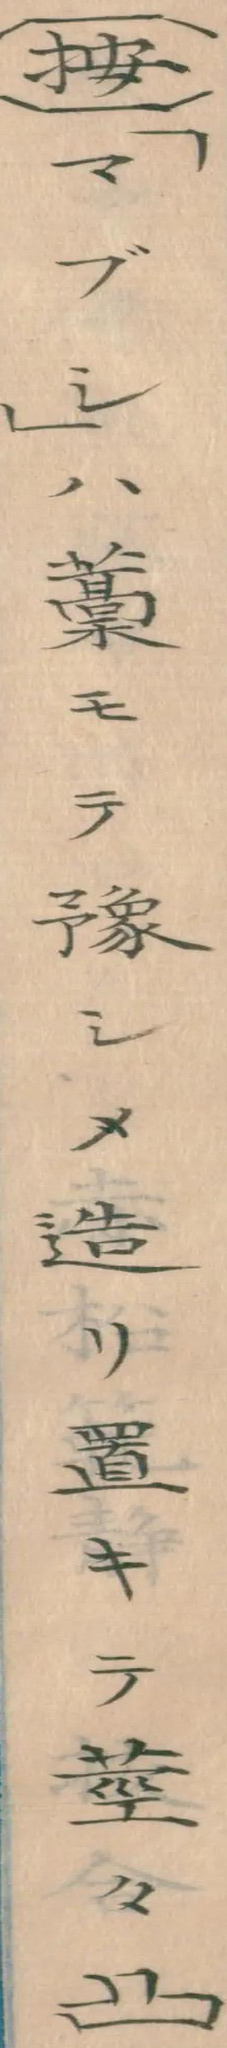[按]「マブシ」ハ藁モテ予シメ造リ置キテ茎々凸
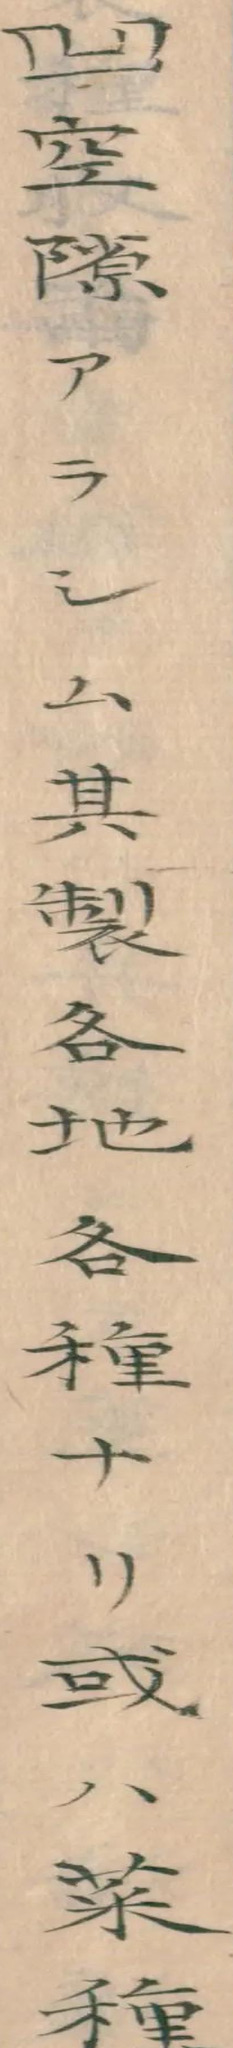凹空隙アラシム其製各地各種ナリ或ハ菜種
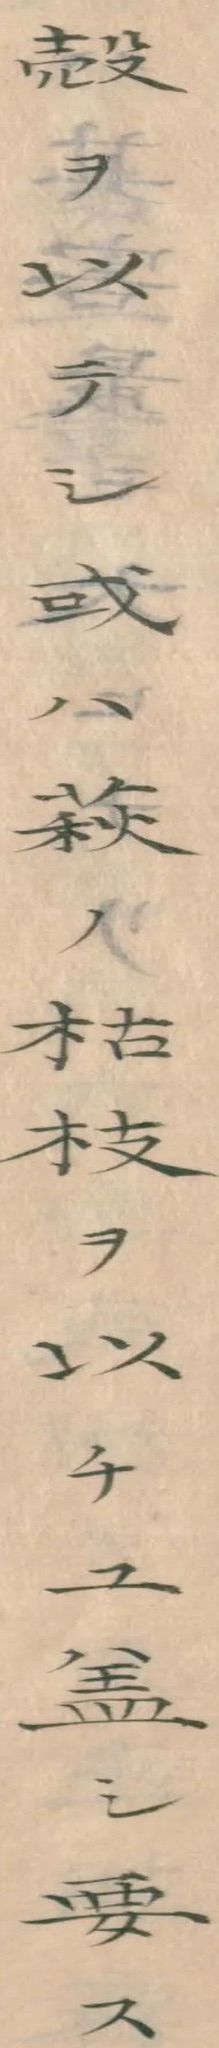殻ヲ以テシ或ハ萩ノ枯枝ヲ以チユ蓋シ要ス
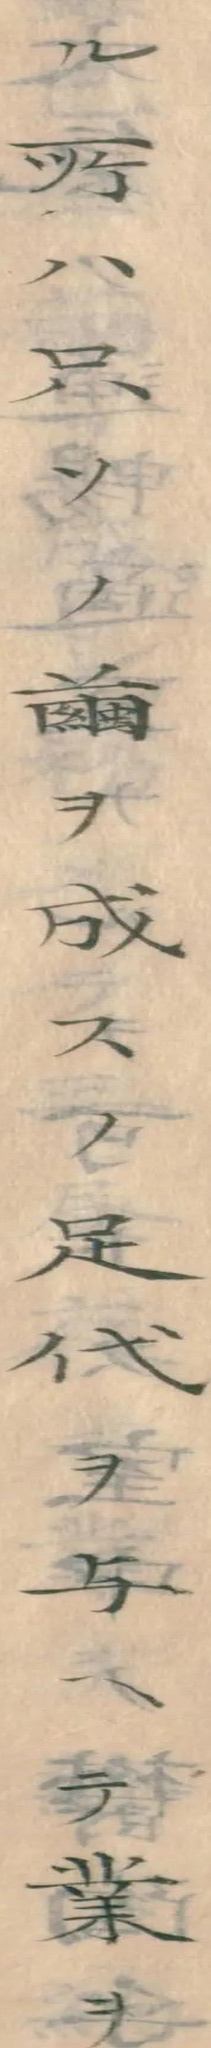ル所ハ只ソノ繭ヲ成スノ足代ヲ与ヘテ業ヲ
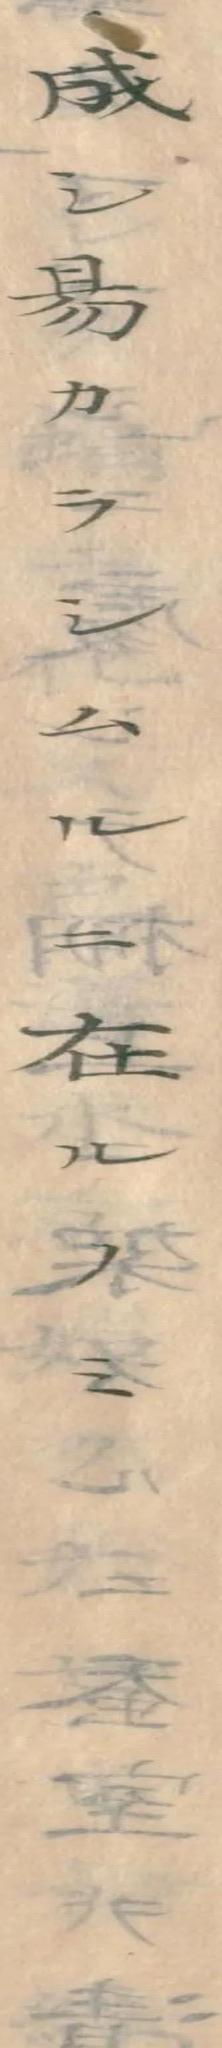成シ易カラシムルニ在ルノミ
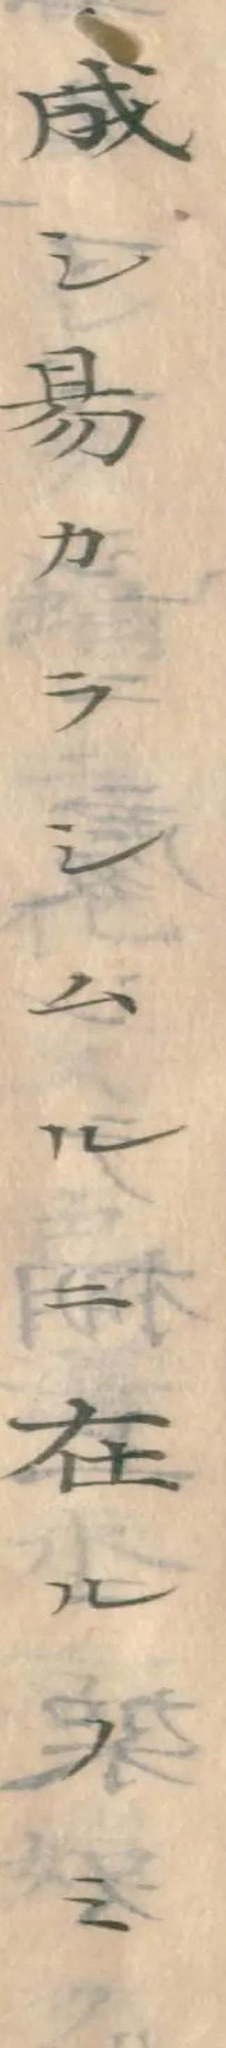成シ易カラシムルニ在ルノミ
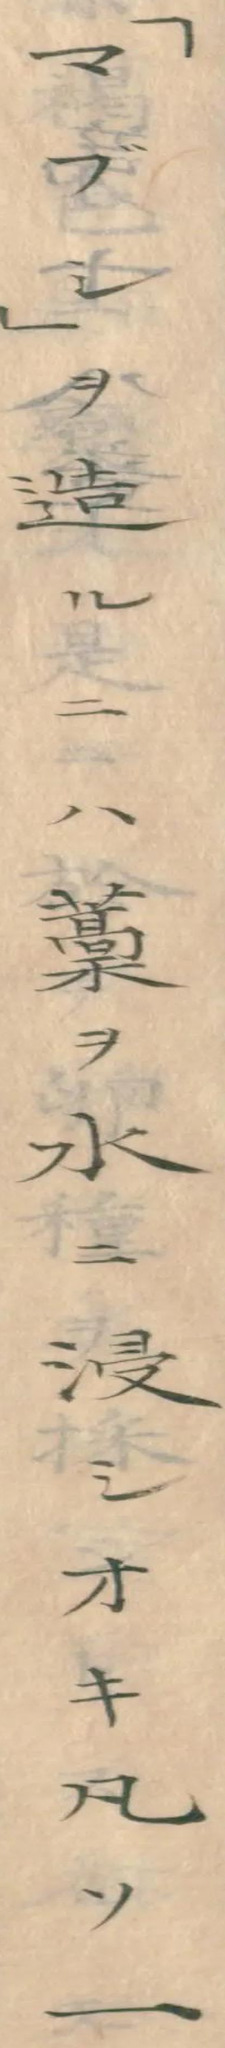「マブシ」ヲ造ルニハ藁ヲ水ニ浸シオキ凡ソ一
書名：蚕桑集成
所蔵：国立国会図書館 National Diet Library, JAPAN
